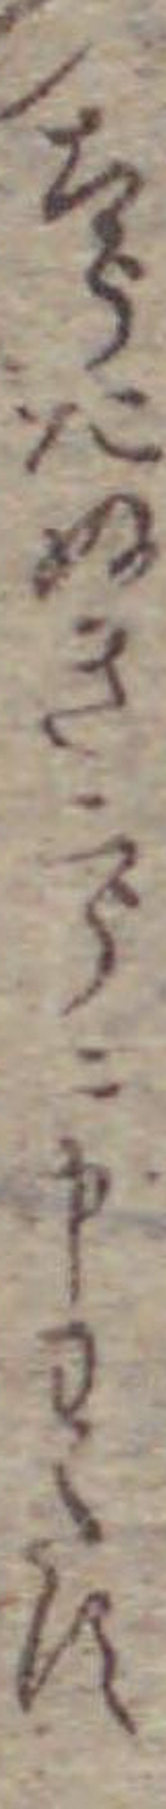太郎たぬき次郎に申わたす

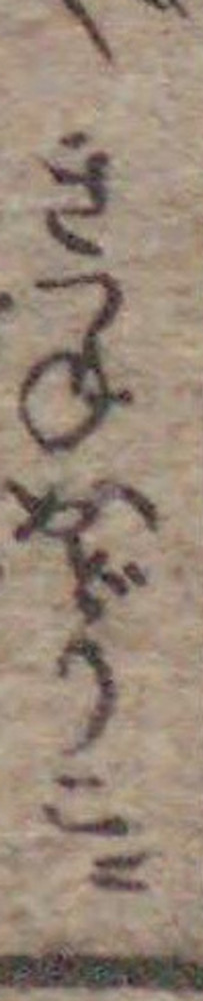きつねおどりこに
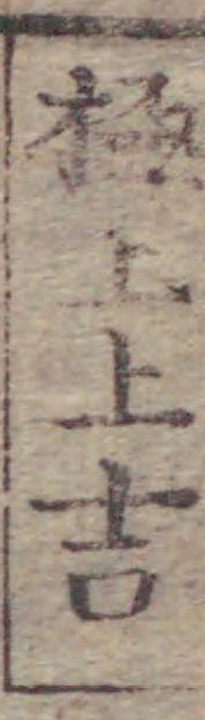極上上吉
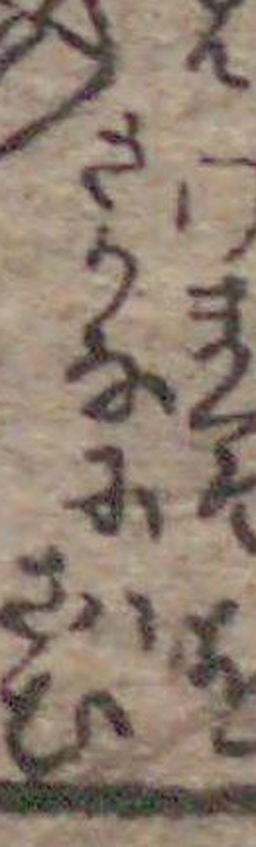さかなには
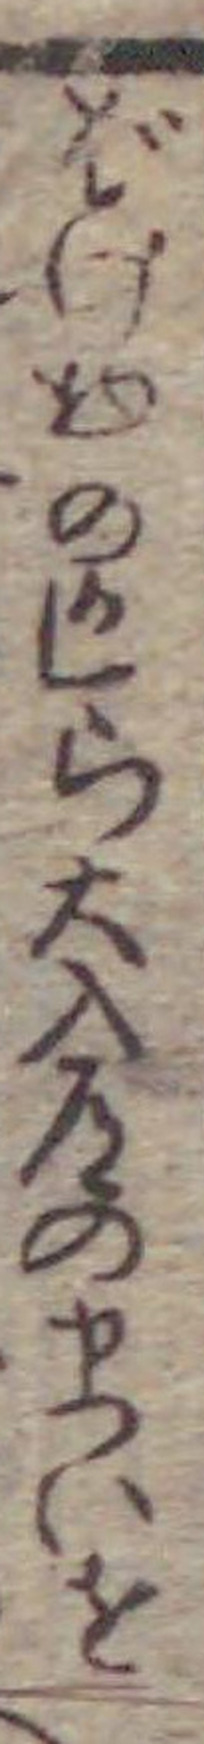ばけ物のかしら大入道の申ついを
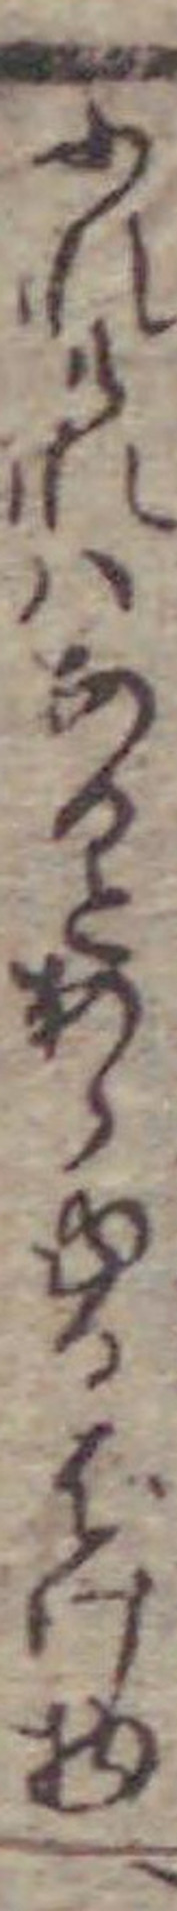ふれけれはあるとあらゆるはけ物
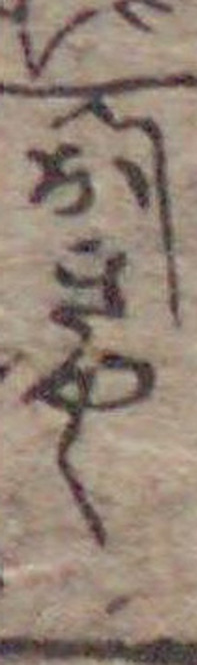〽おきやく
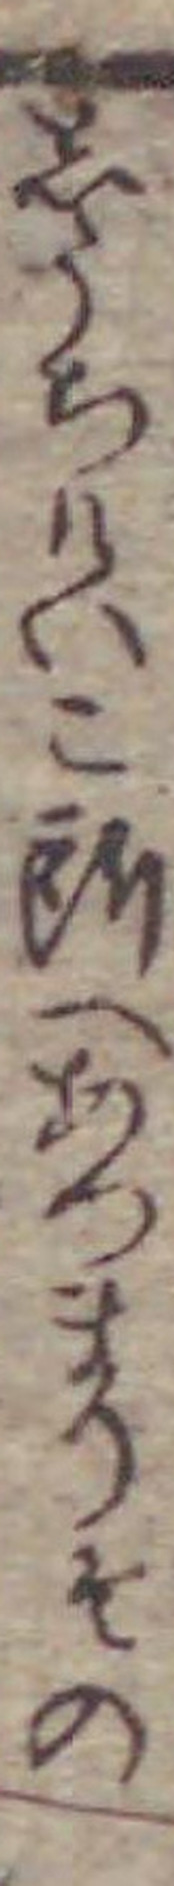しうちけいこ所へあつあまりその
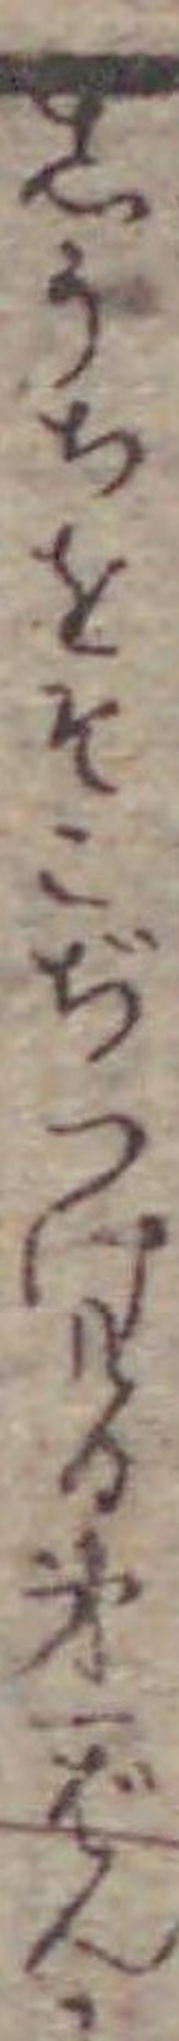しうちをそこぢつけける第一ばんに
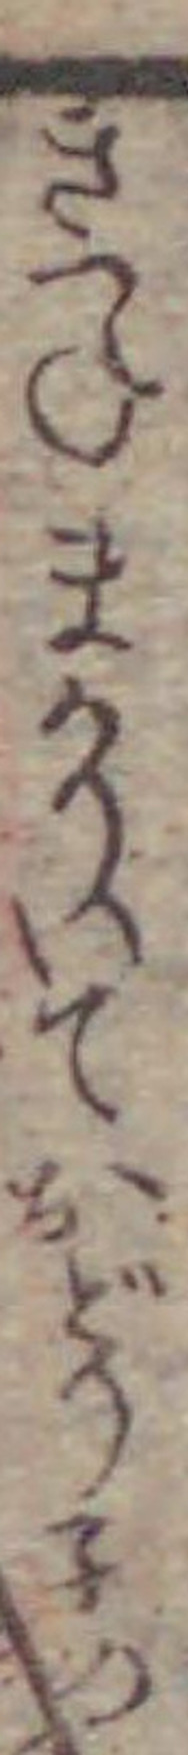きつねまかりいておどり子の
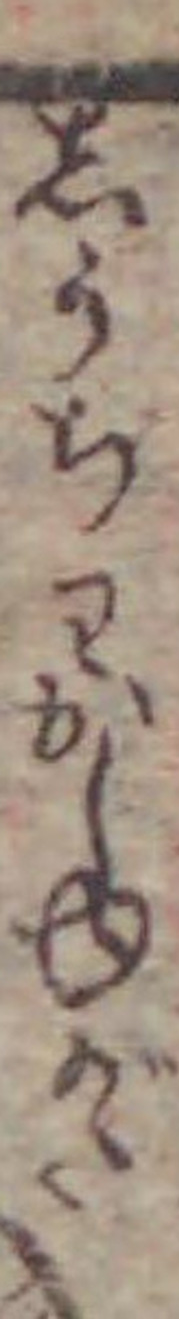しうちわかしゆがた
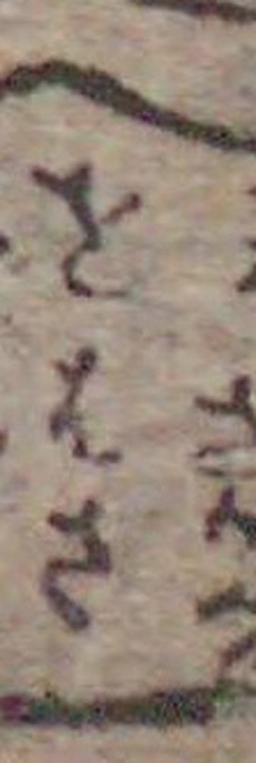をはさ
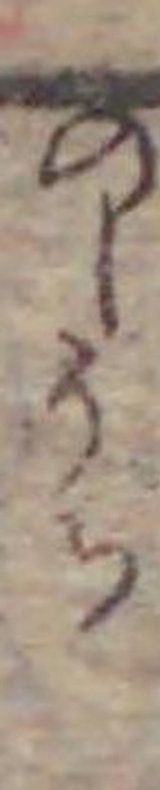のしうち
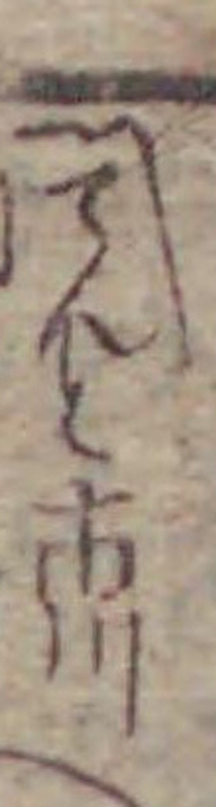〽てんと市川
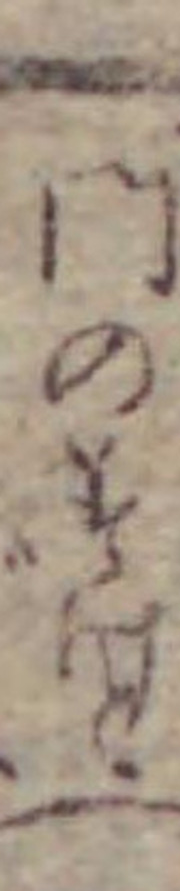門のすけと
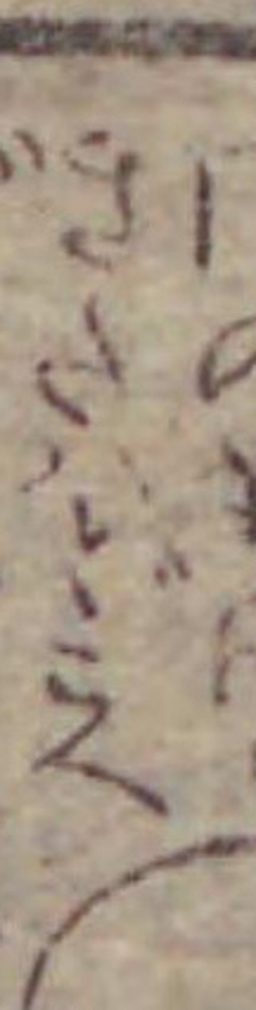きたはどこへ
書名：妖怪仕内評判記 : 2巻
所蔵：国立国会図書館 National Diet Library, JAPAN
